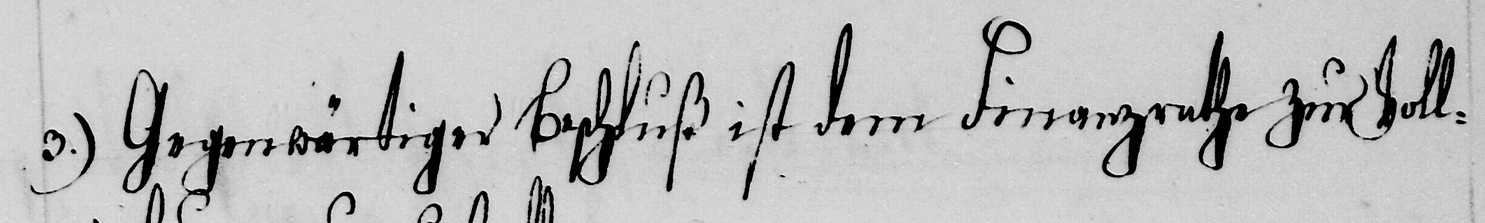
3.) Gegenwärtiger Beschluß ist dem Finanzrathe zur Voll¬
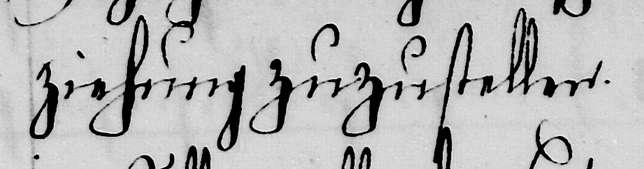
ziehung zuzustellen.
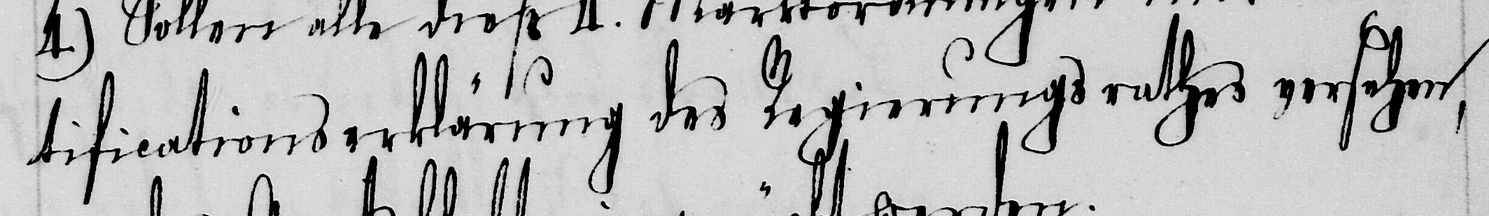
tificationserklärung des Regierungsrathes versehen,
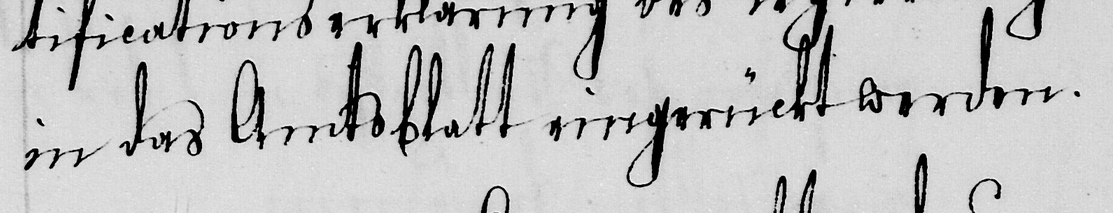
in das Amtsblatt eingerückt werden.
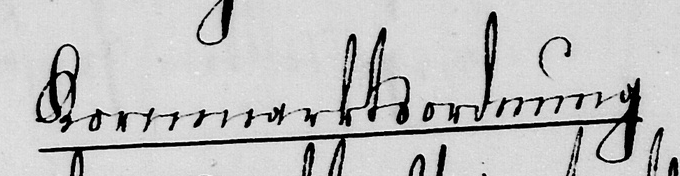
Kornmarktsordnung
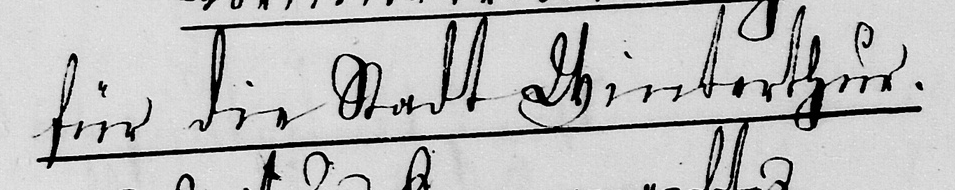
für die Stadt Winterthur.
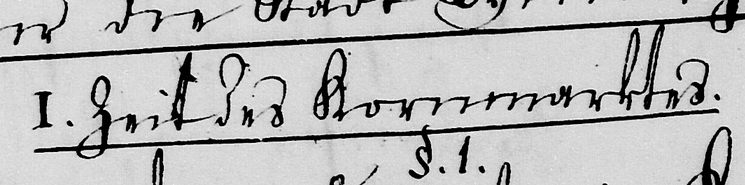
I. Zeit des Kornmarktes.
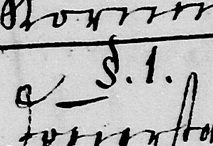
§.1.
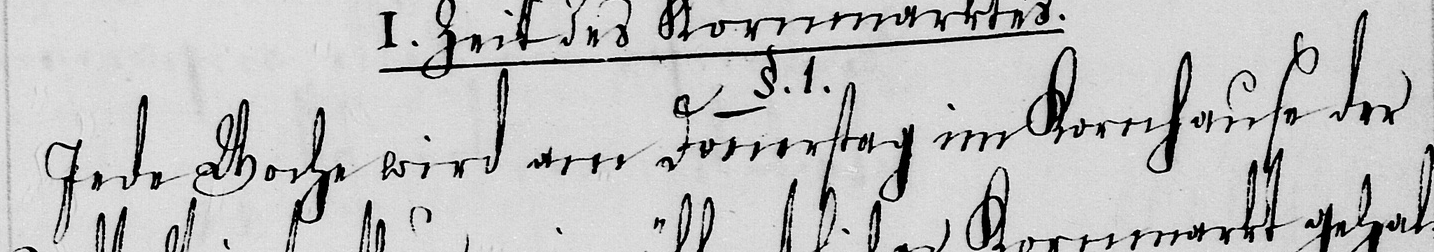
Jede Woche wird am Donnerstag im Kornhause der
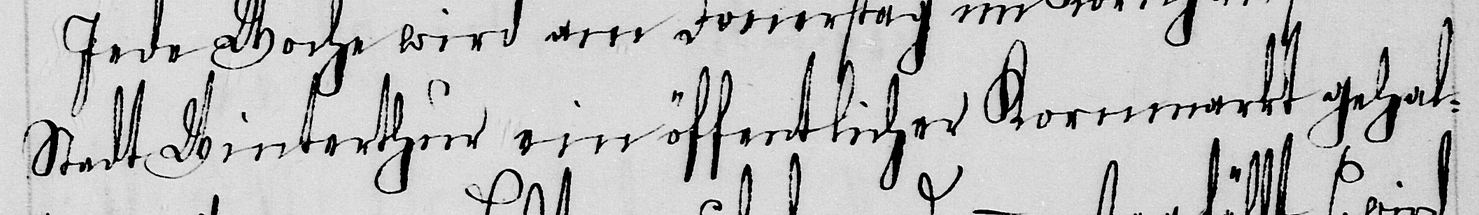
Stadt Winterthur ein öffentlicher Kornmarkt gehal¬
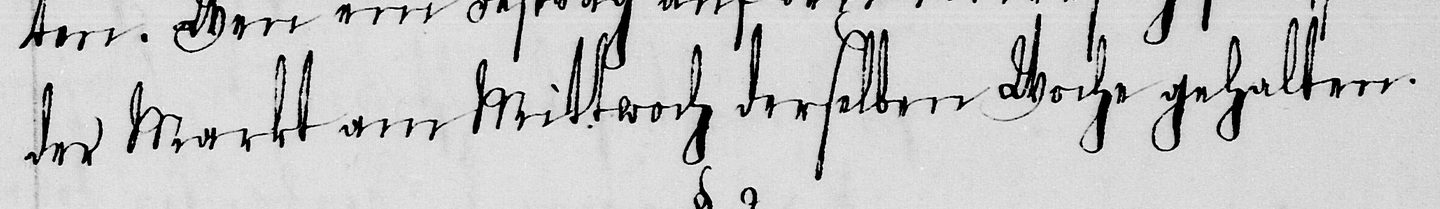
der Markt am Mittwoch derselben Woche gehalten.
